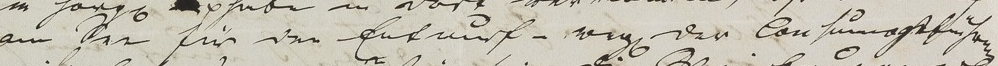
am See für den Entwurf – wegen der Consumogebühren
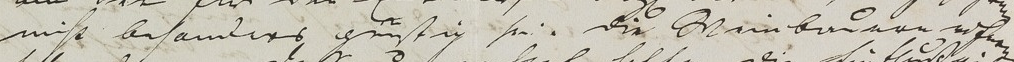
nicht besonders günstig sei. Die Weinbauern eifern
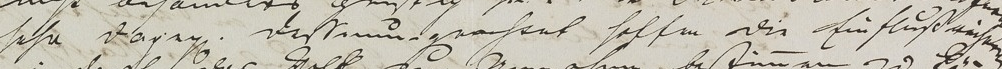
sehr dagegen. Dessenungeachtet hoffen die Einflußreichern
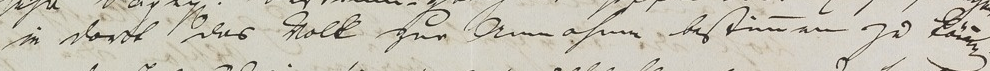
in dort das Volk zur Annahme bestimmen zu können. –
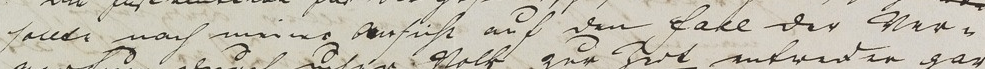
sollte nach meiner Ansicht auf den Fall der Ver-
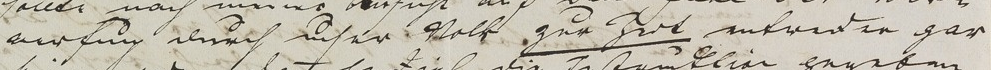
werfung durch unser Volk zur Zeit entweder gar
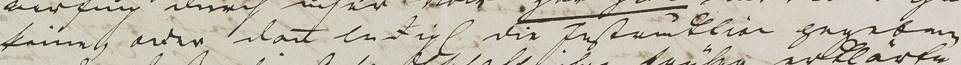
keine, oder dann lediglich die Instrucktion gegeben
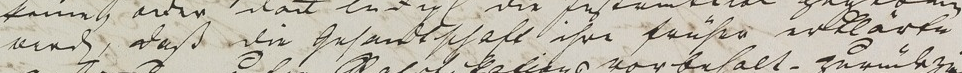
werden, daß die Gesandtschaft ihre früher erklärte
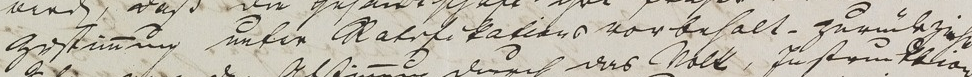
Zustimmung unter Ratifikationsvorbehalt – zurückziehe.
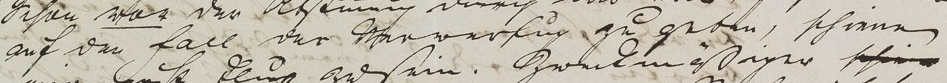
auf den Fall der Verwerfung zu geben, schiene
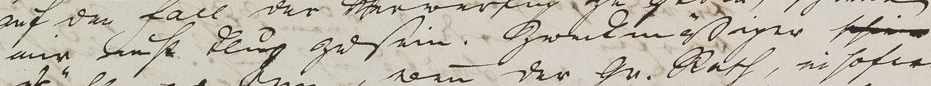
mir nicht klug zu sein. – Zweckmäßiger schiene
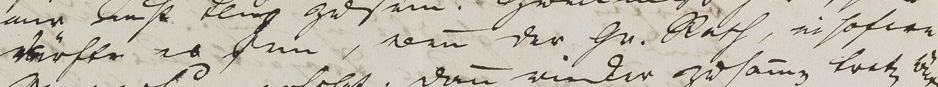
dürfte es sein, wenn der Gr. Rath, insofern
